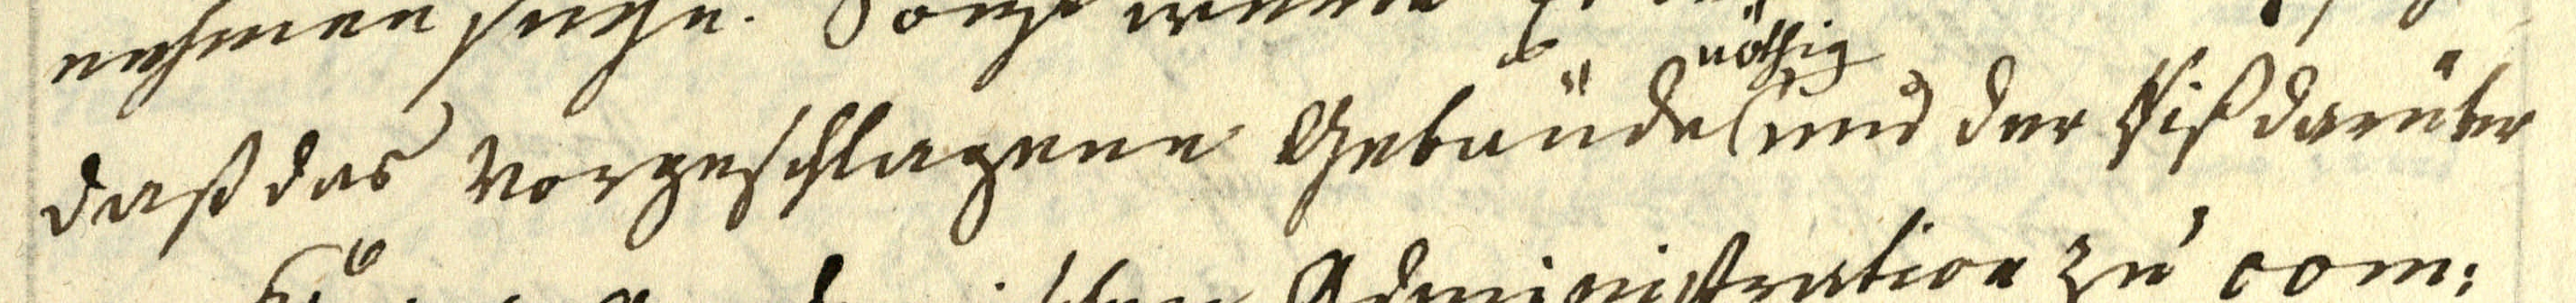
daß das vorgeschlagene Gebäude nöthig und der Riß darüber
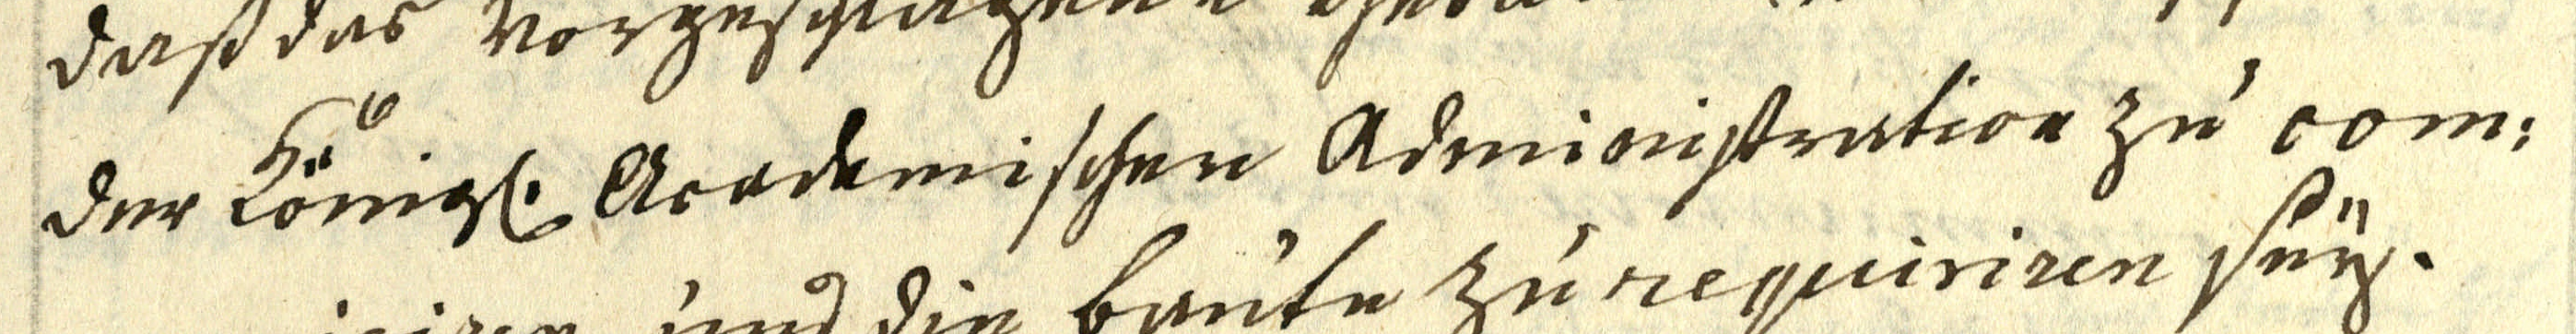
der Königl. Academischen Administration zu com¬
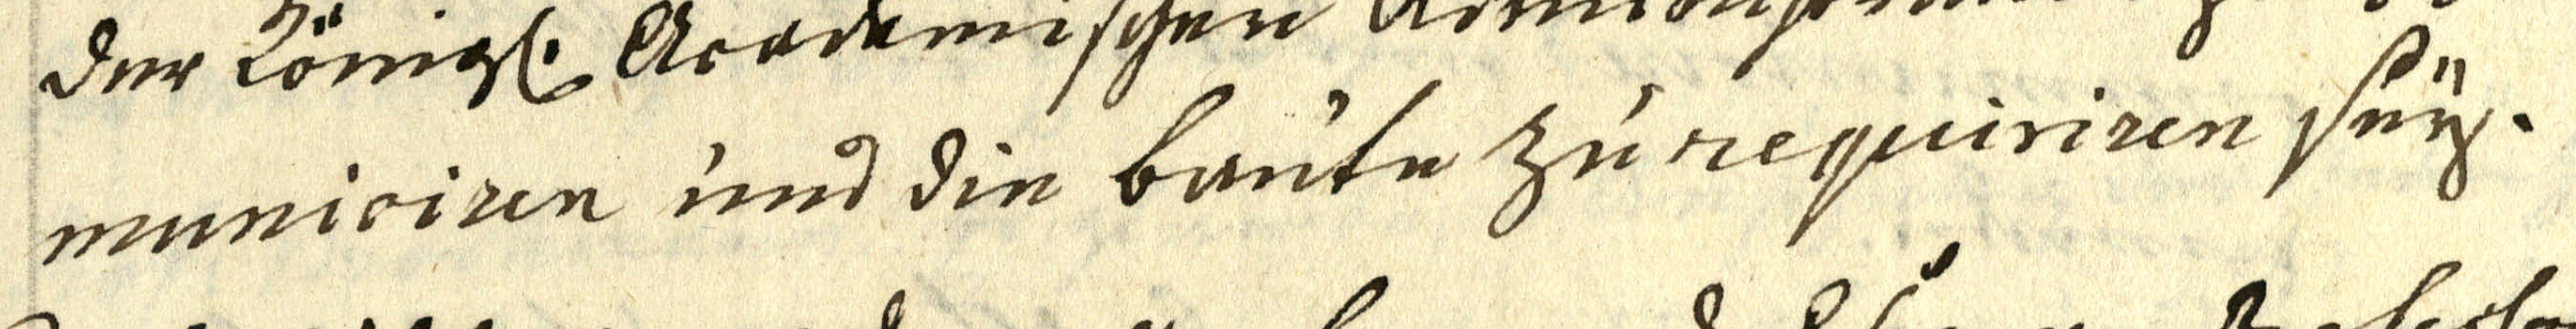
municiren und die Baute zu requiriren seÿ.
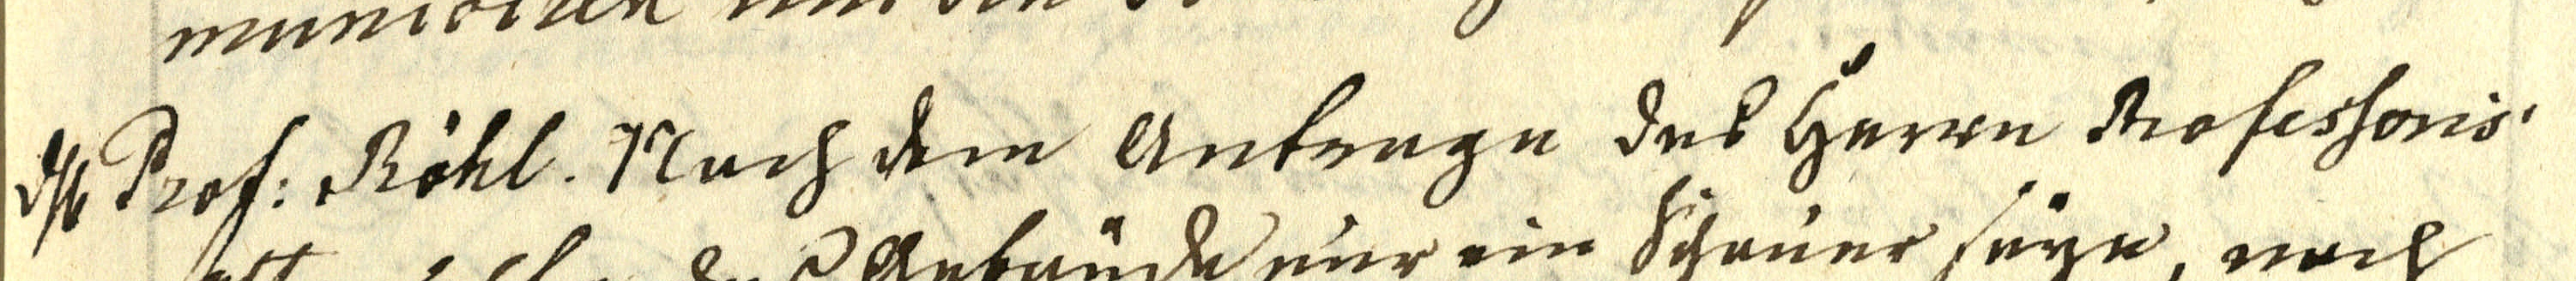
dh Prof. Röhl. Nach dem Antrage des Herrn Professoris
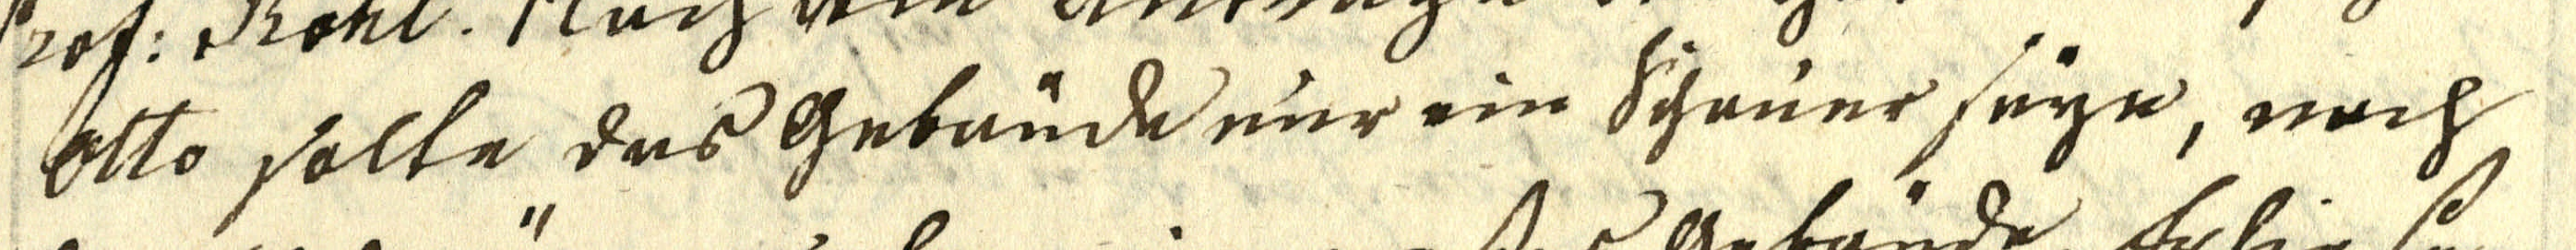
Otto solte das Gebäude nur ein Schauer seÿn, nach
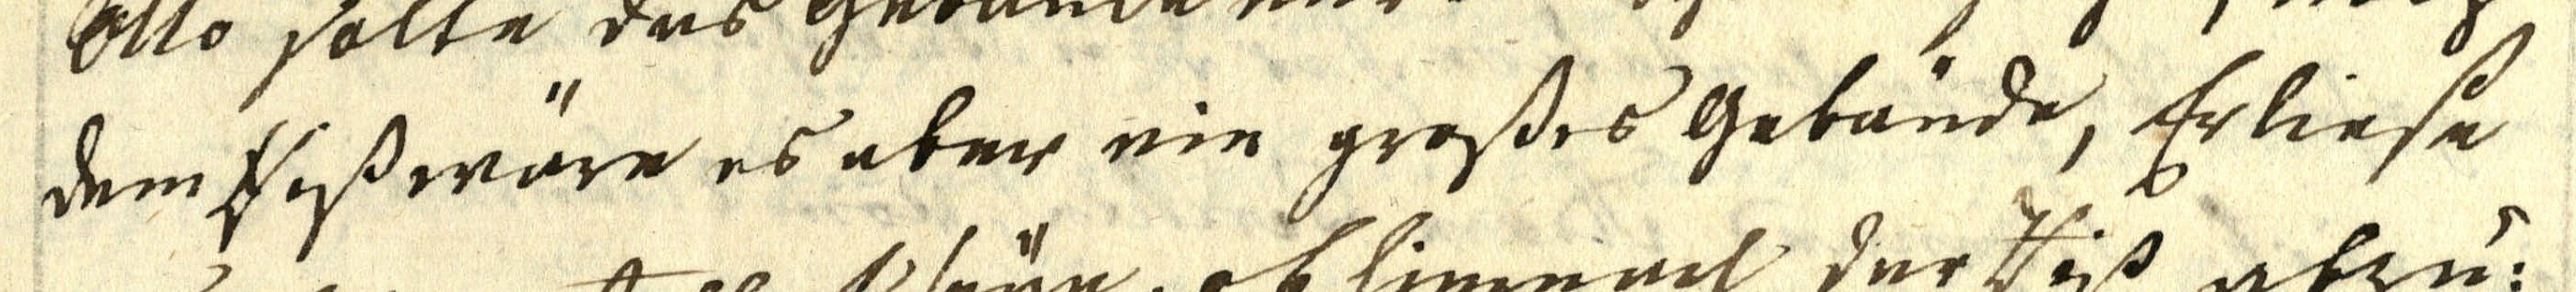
dem Riß wäre es aber ein großes Gebäude, Er ließe
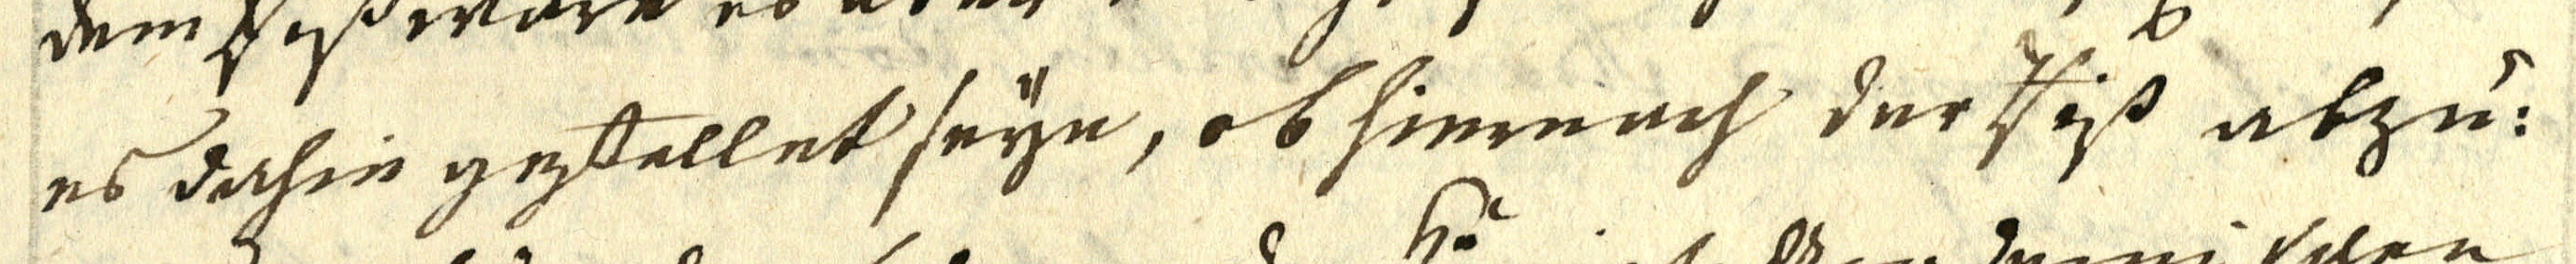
es dahin gestellet seÿn, ob hiernach der Riß abzu¬
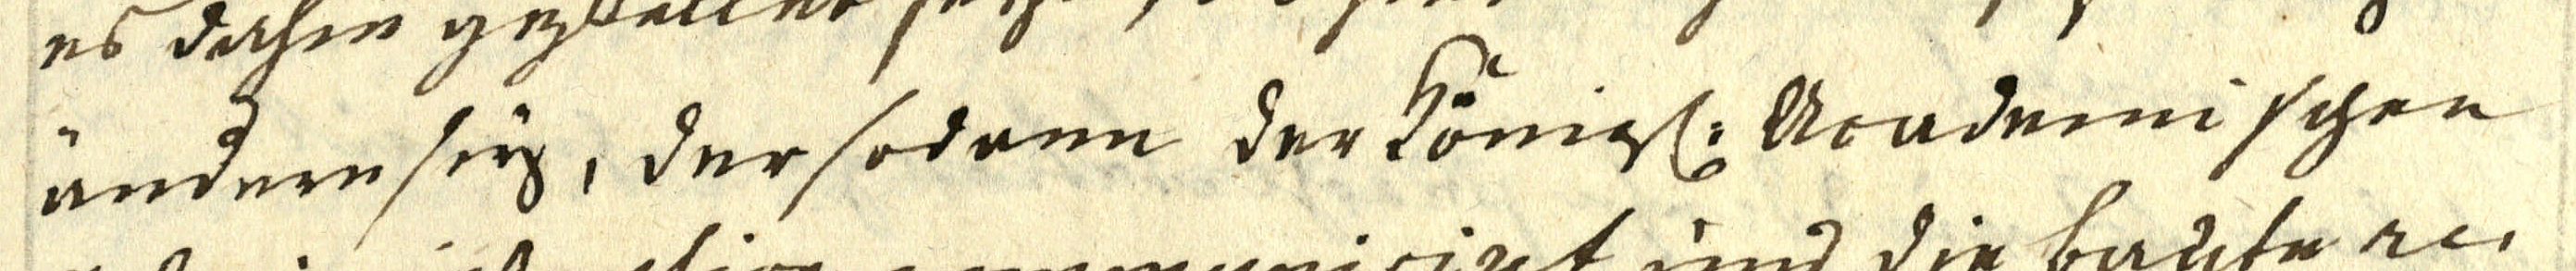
ändern seÿ, der sodann der Königl. Academischen
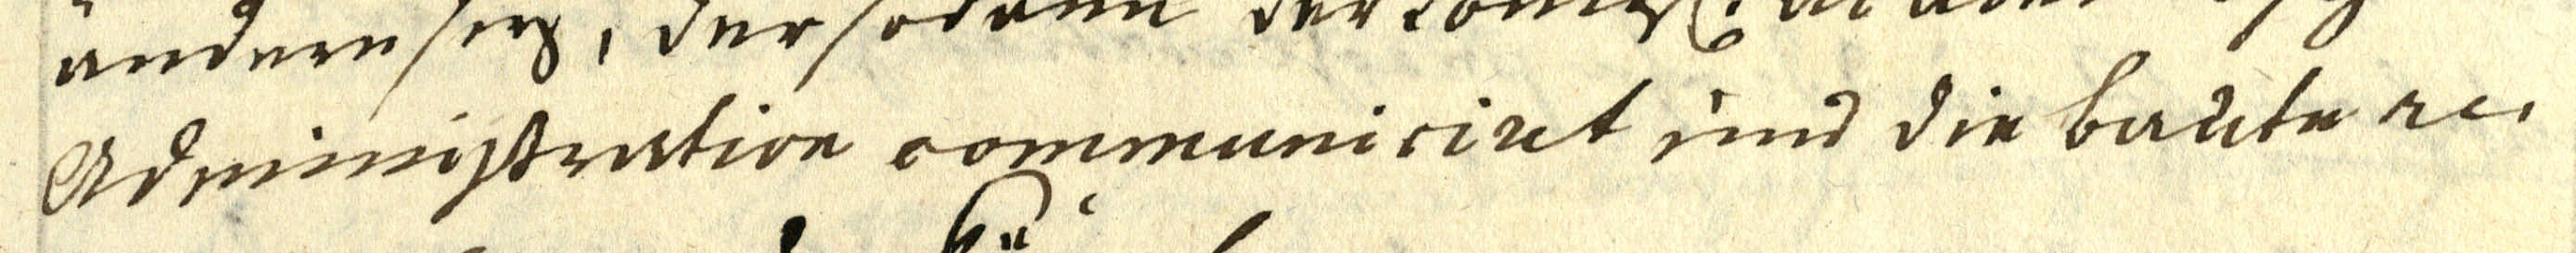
Administration communiciret und die Baute re¬
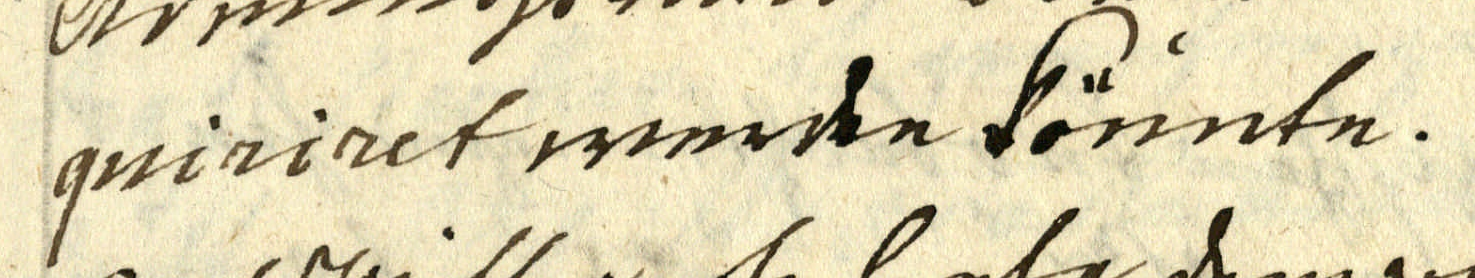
quiriret werden könnte.
